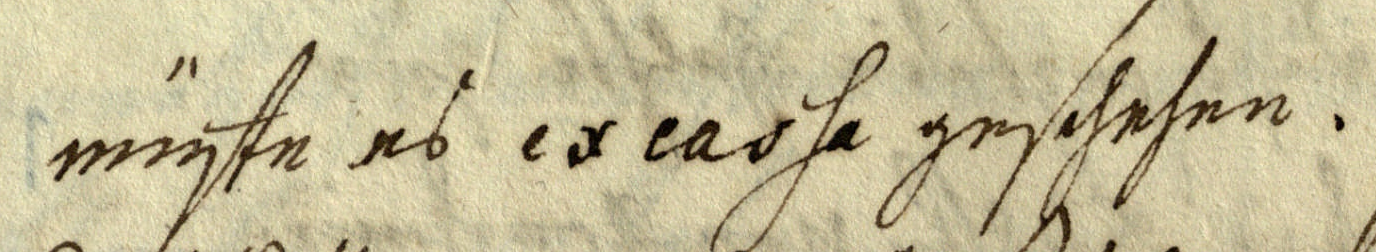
müste es ex cassa geschehen.
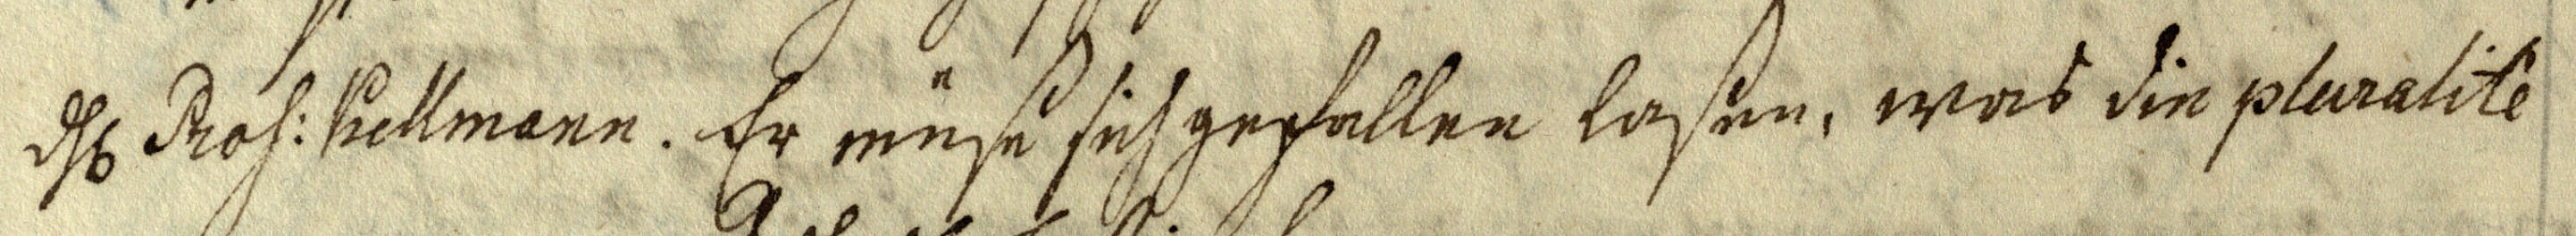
dh Prof: Kellmann. Er müße sich gefallen laßen, was die pluralité
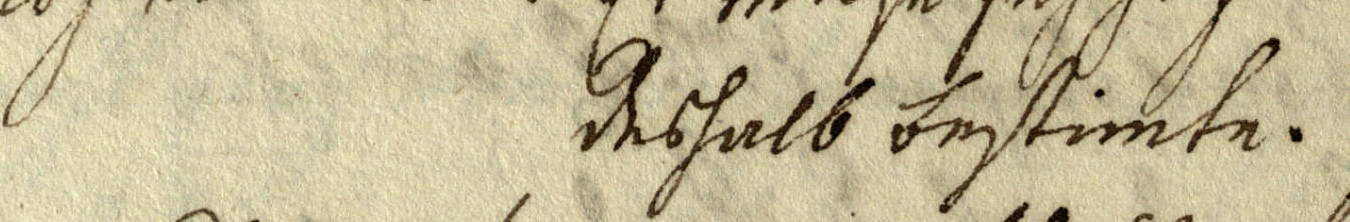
deshalb bestimte.
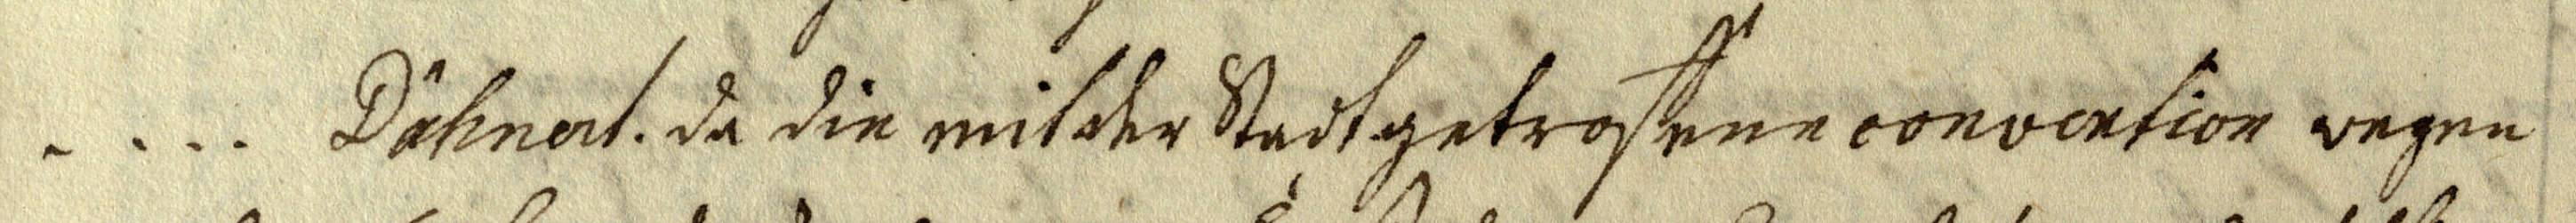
Dähnert. da die mit der Stadt getroffene convention wegen
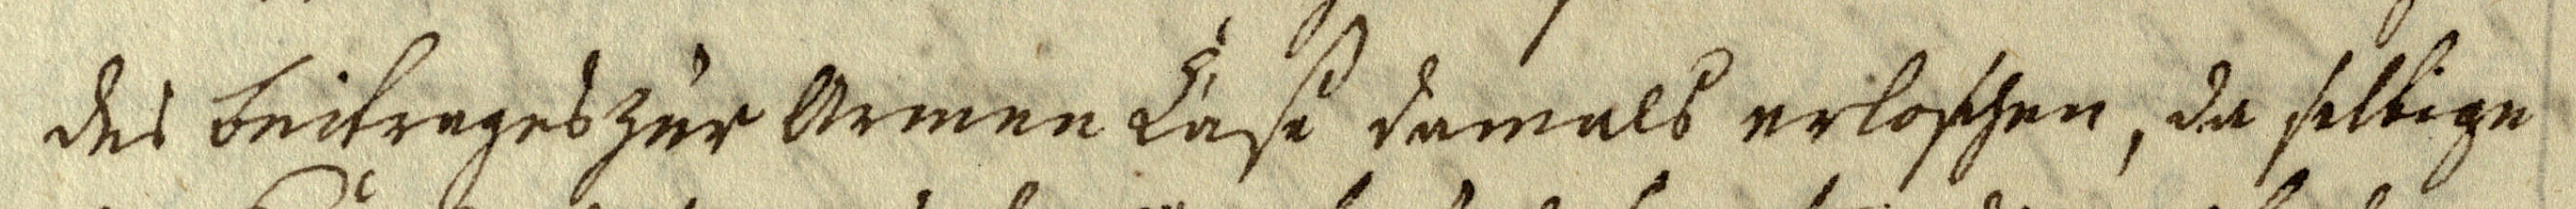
des Beitrags zur Armen Caße damals erloschen, da selbige
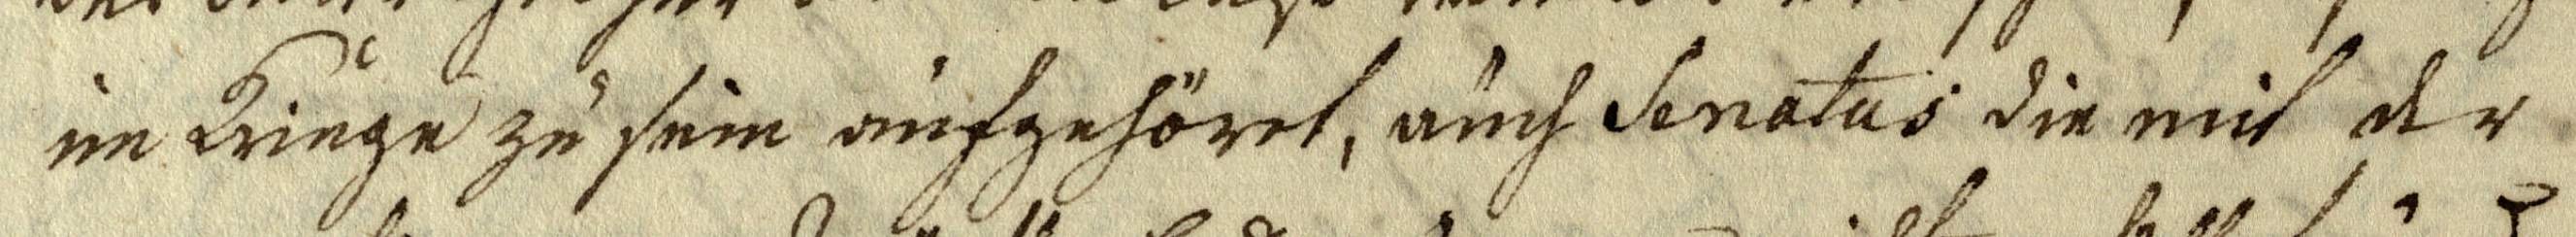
im Kriege zu sein aufgehöret, auch Senatus die mit der
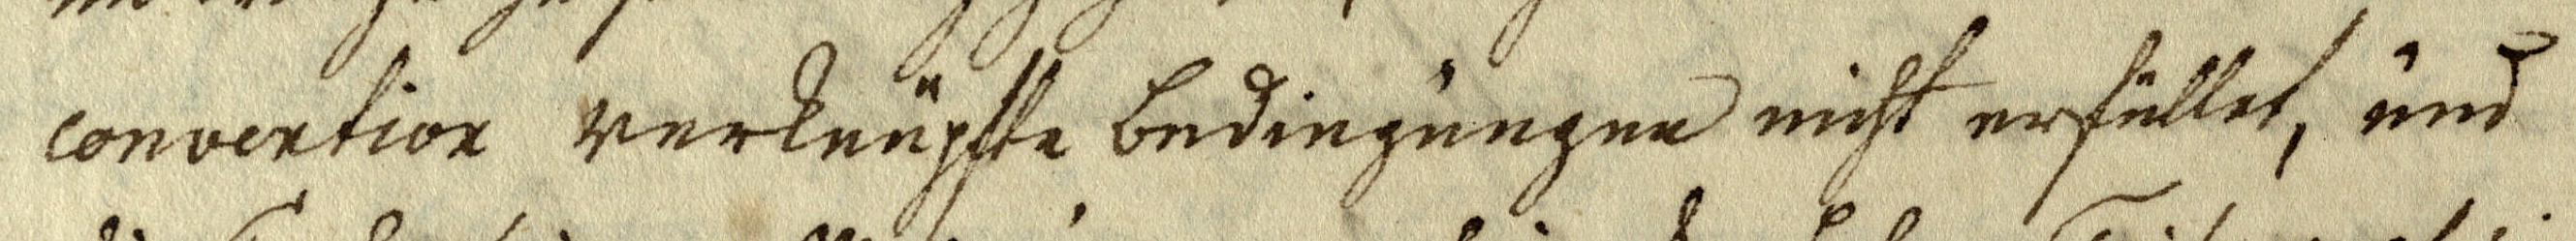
convention verknüpfte Bedingungen nicht erfüllet, und
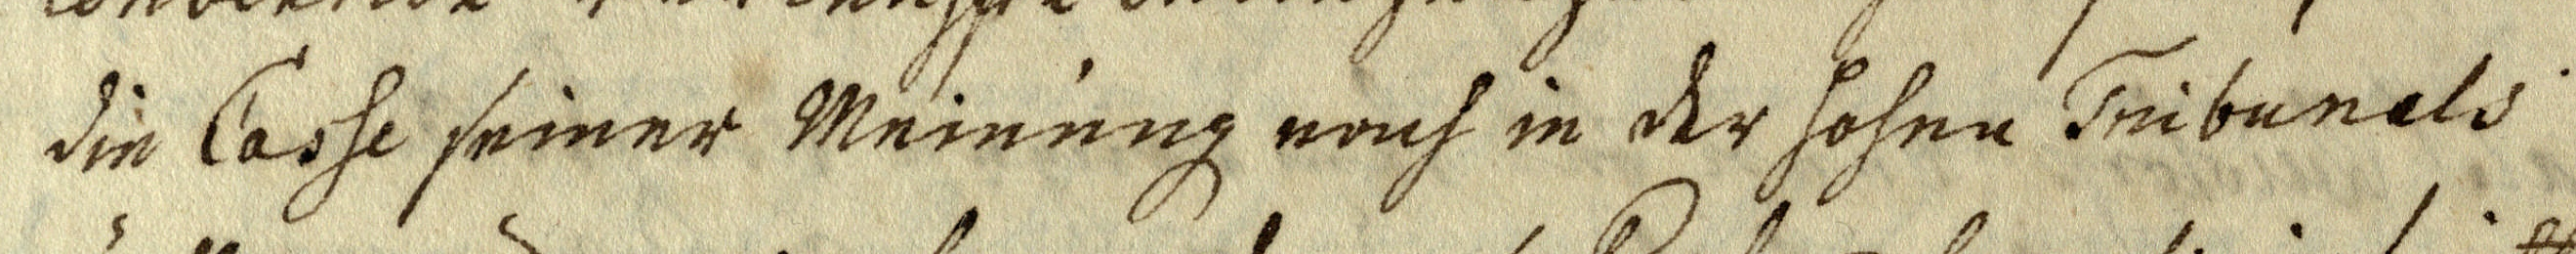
die Casse seiner Meinung nach in der hohen Tribunals
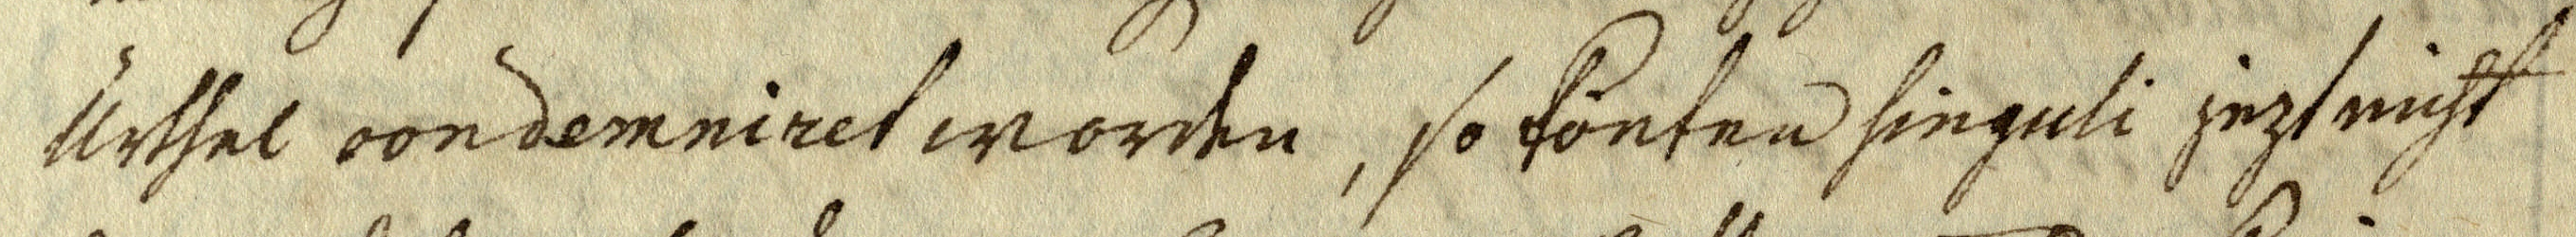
Urthel condemniret worden, so könten singuli jezt nicht
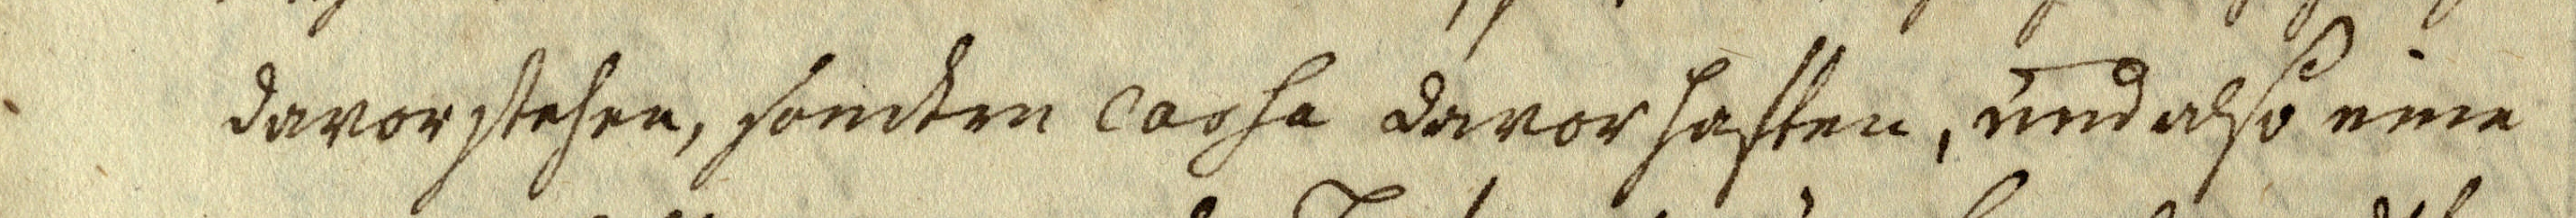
davor stehen, sondern cassa davor haften, und also eine
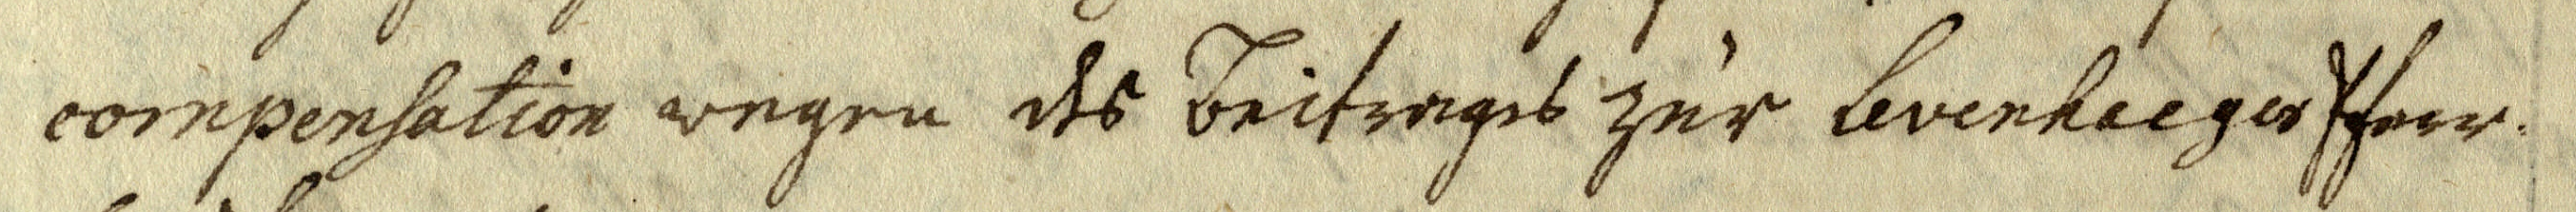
compensation wegen des Beitrages zur Levenhaeger Pfarr¬
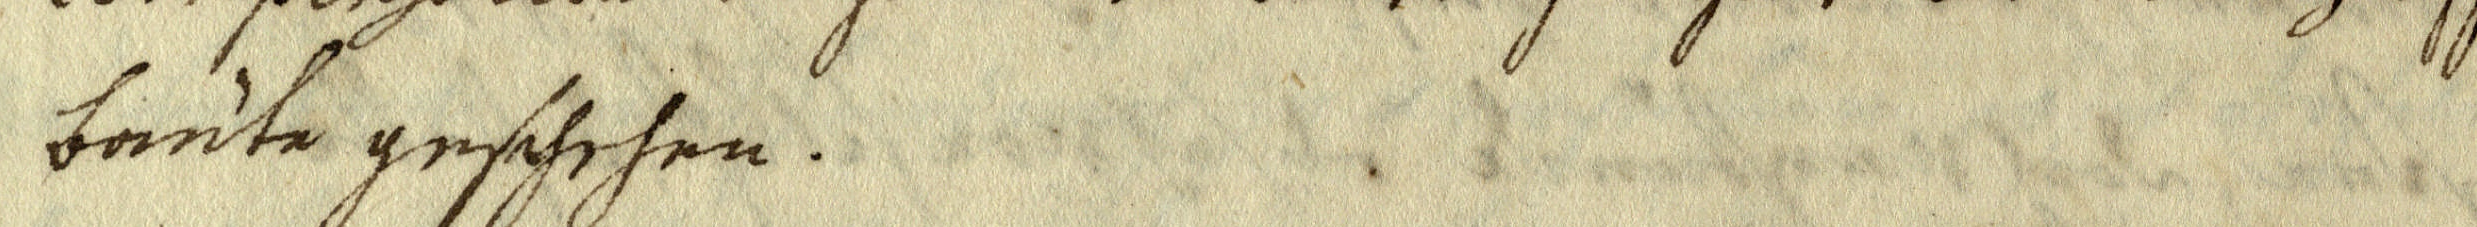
baute geschehen.
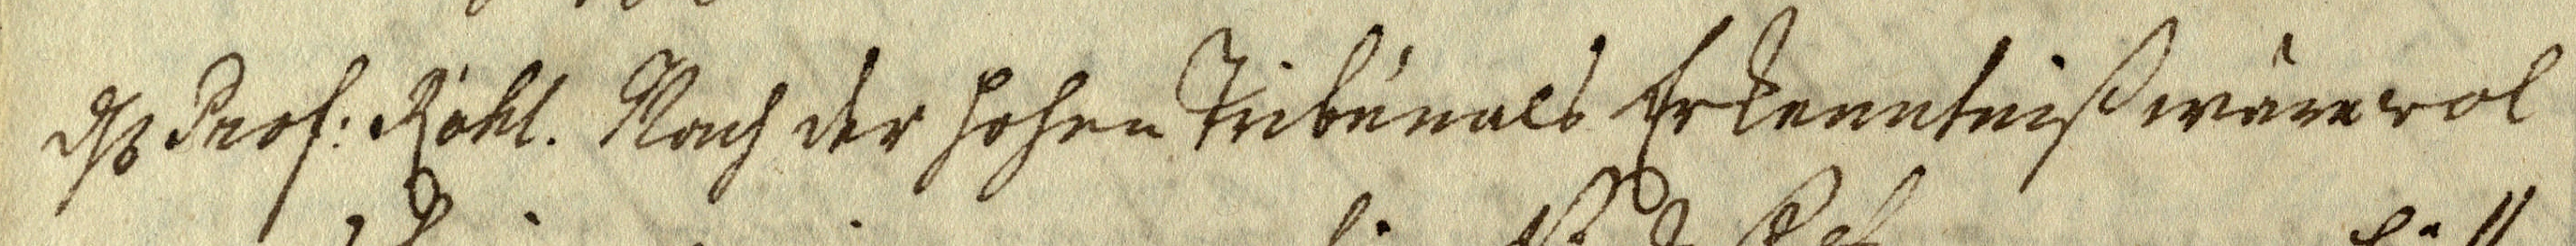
dh Prof. Röhl. Nach der hohen Tribunals Erkenntniß wäre wol
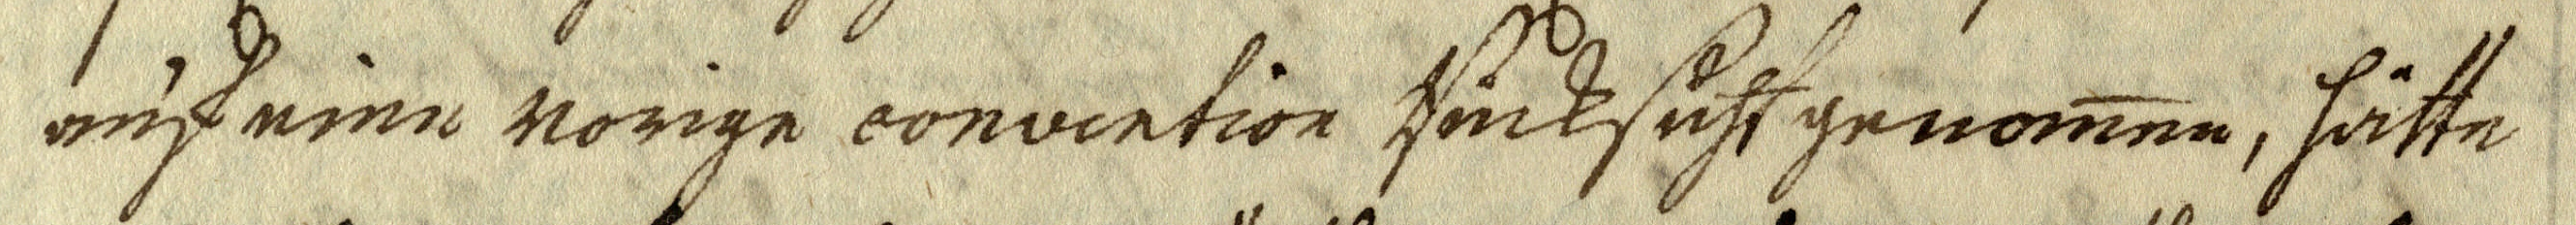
auf eine vorige convention Rücksicht genomen, hätte
